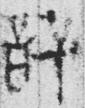訐
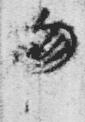利
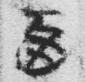西
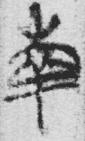南
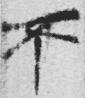不
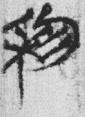利
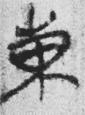東
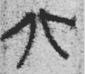北
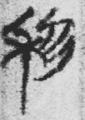利
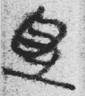見
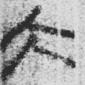大
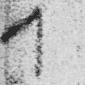人
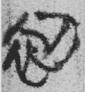初
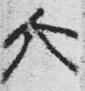六
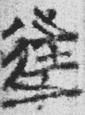○（往）
